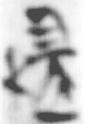椯
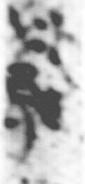轂
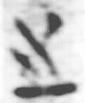之
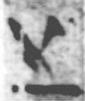之
